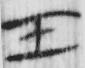壬
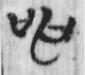申
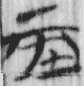坪
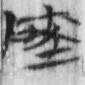陵
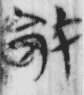○（令）
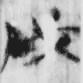戊
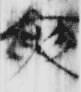寅
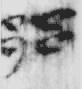呂
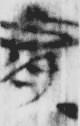前
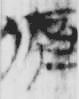雁
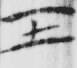壬
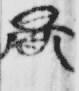晨
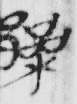鄵
